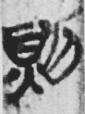則（則）
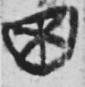困
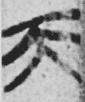天〈而〉
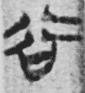谷（欲）
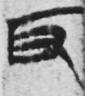反
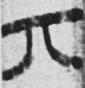亓（其）
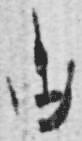古（故）
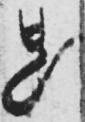也
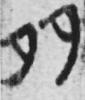多
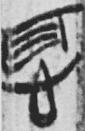恥
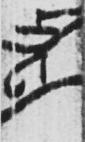者
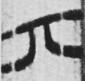亓（其）
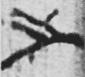之
